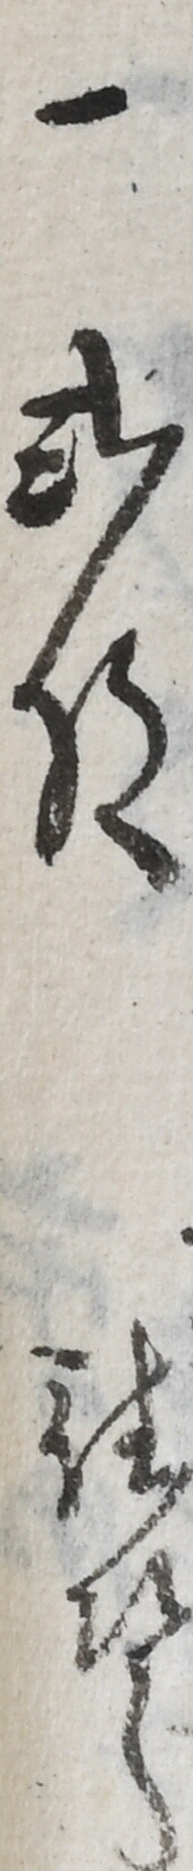一弐枚同人
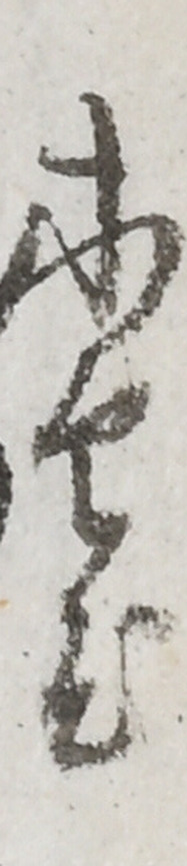木綿屋
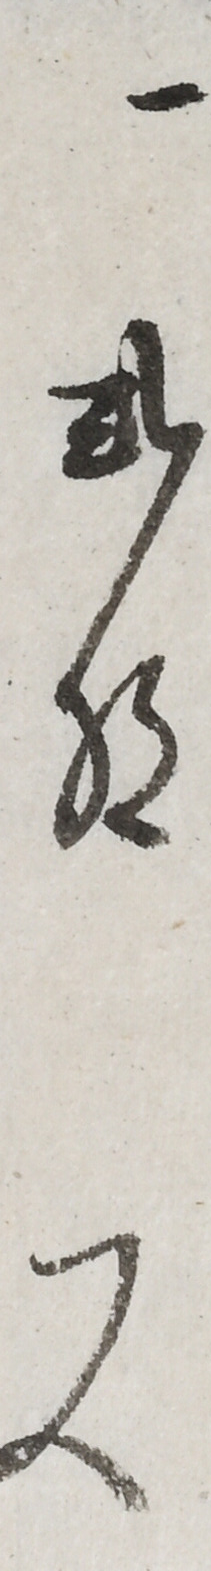一弐枚同人
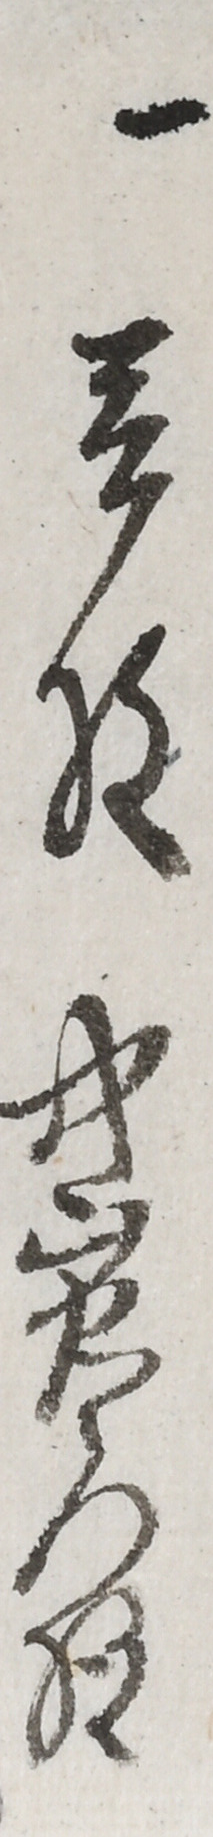一壱枚中安右衛門様
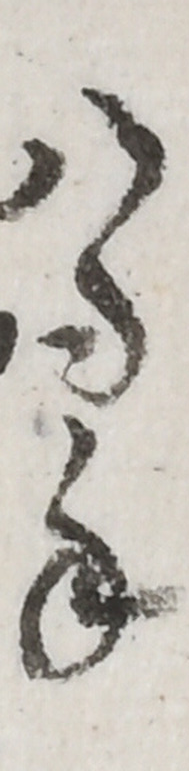八つ手
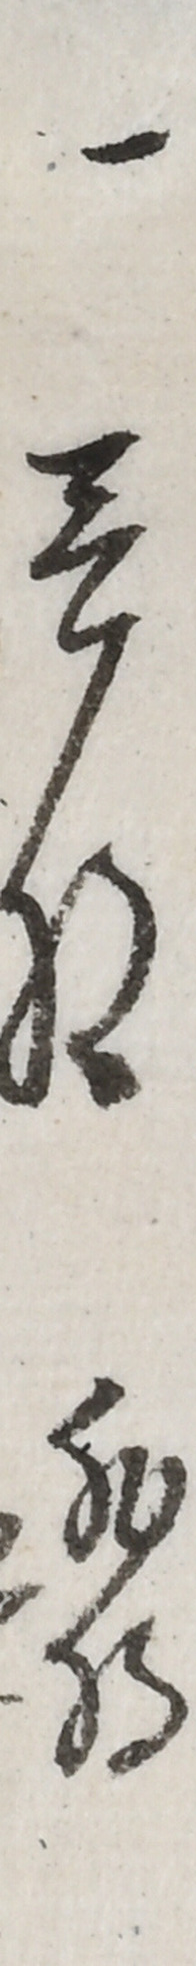一壱枚同人
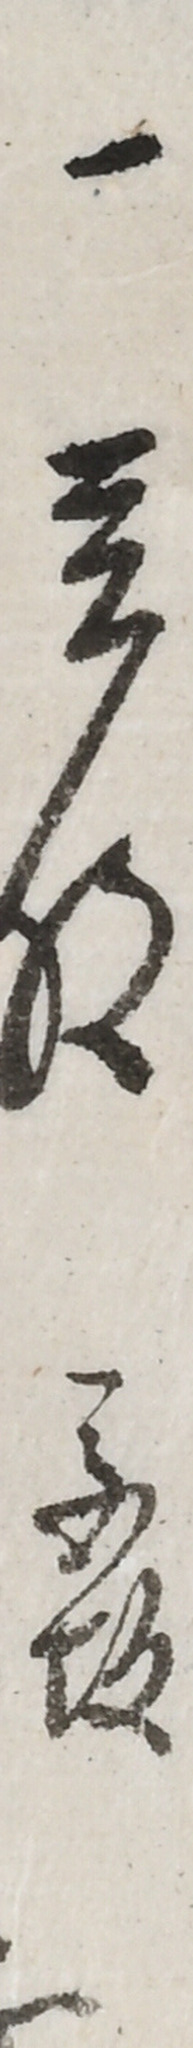一壱枚同人
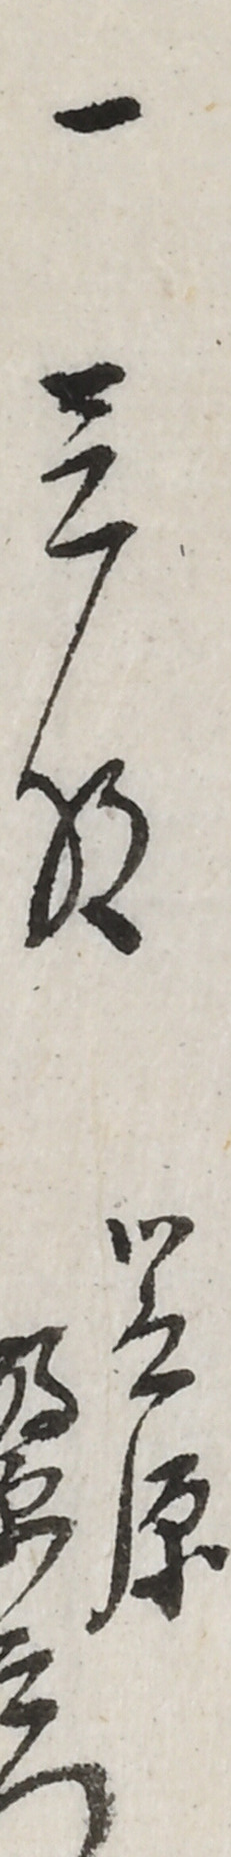一四枚忠右衛門
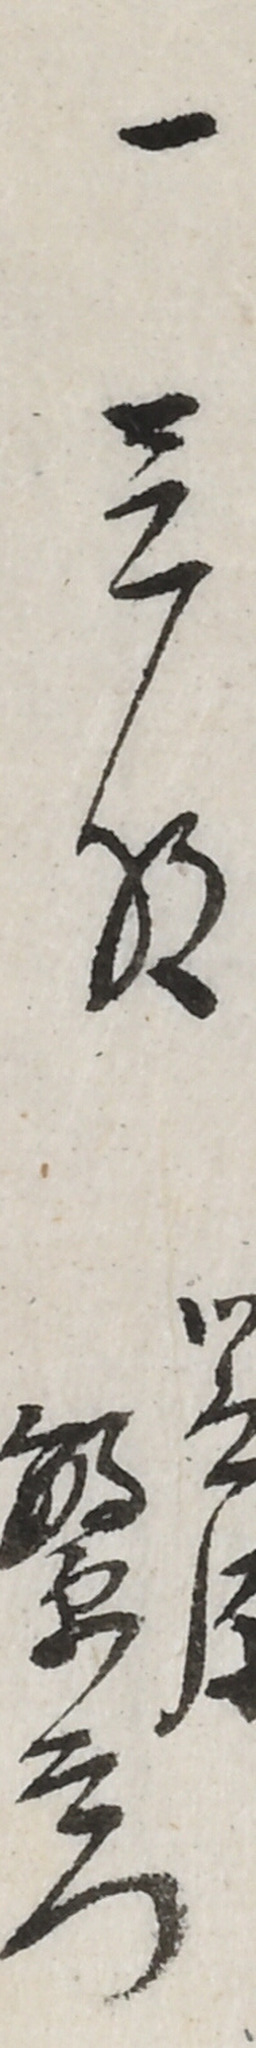一壱枚繁右衛門
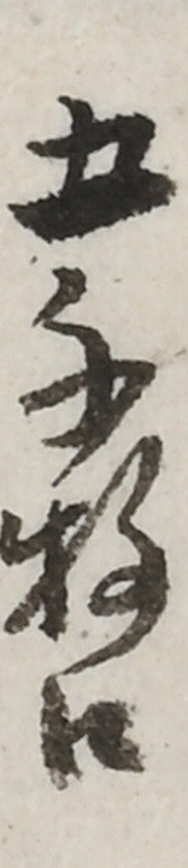五千枚口
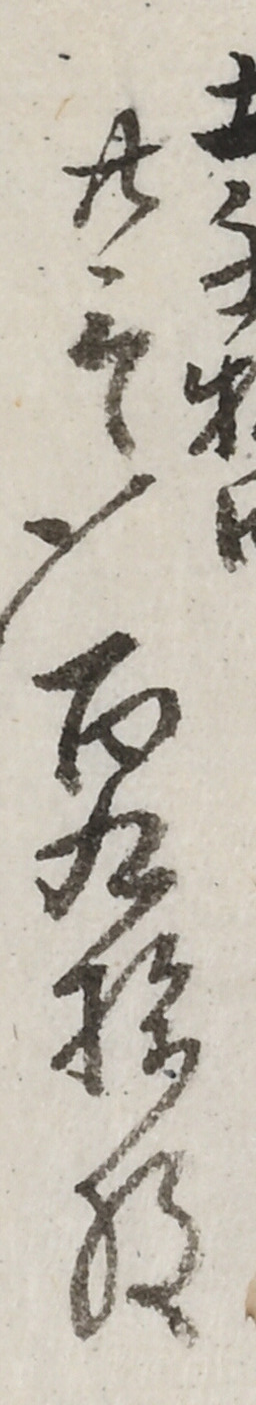廿三日〆百九拾枚
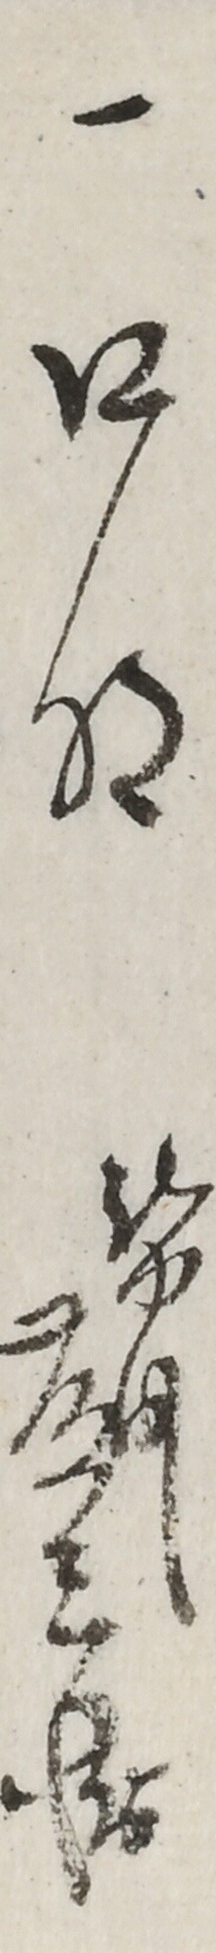一四枚藤兵衛
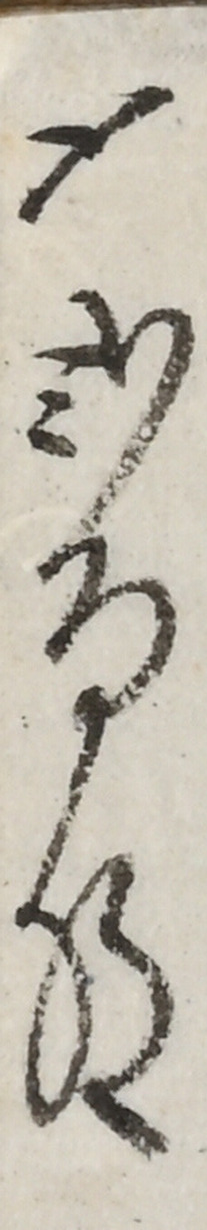〆弐百枚

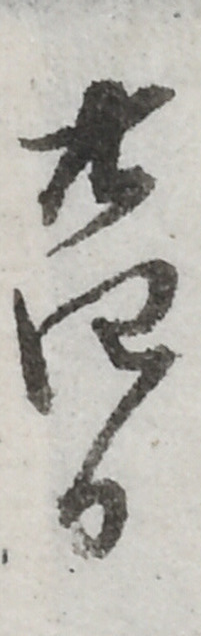廿四日
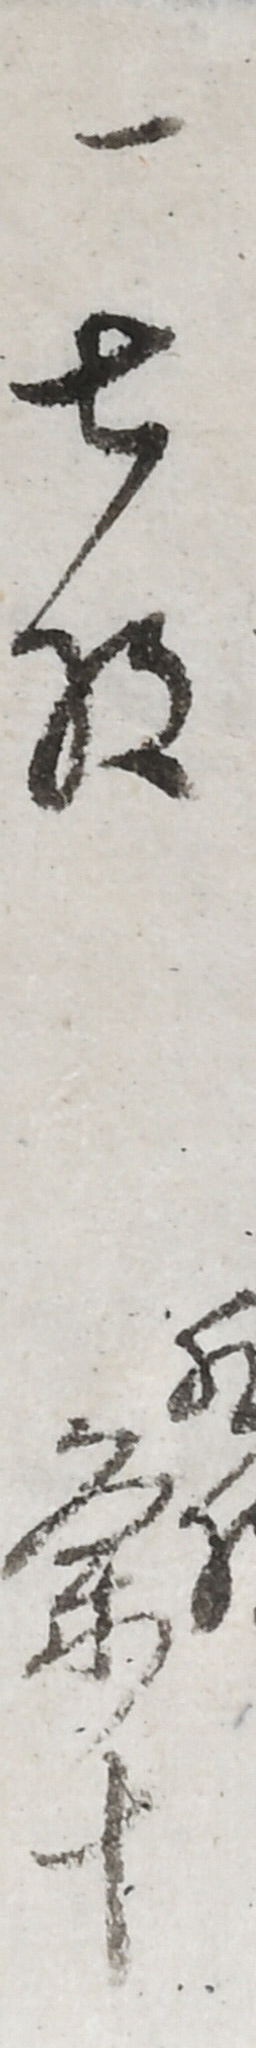一七枚粂十
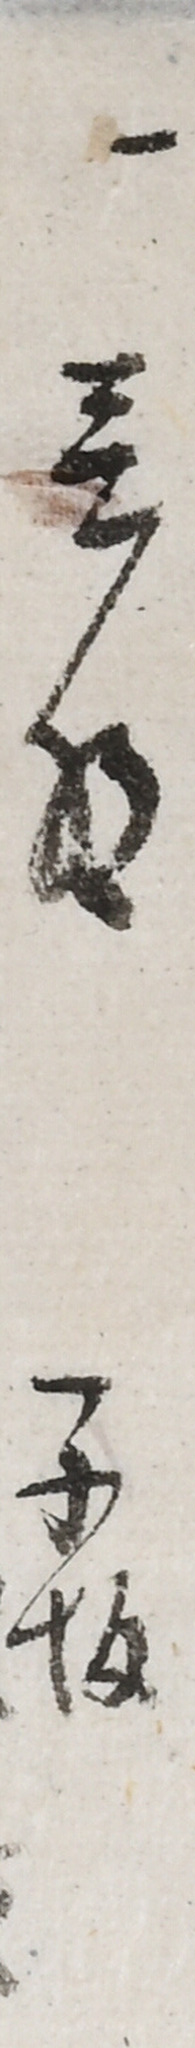一壱枚良吉
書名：髙遠限楮幣引換覚帳
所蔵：伊那市立高遠町図書館・合同会社AMANE
